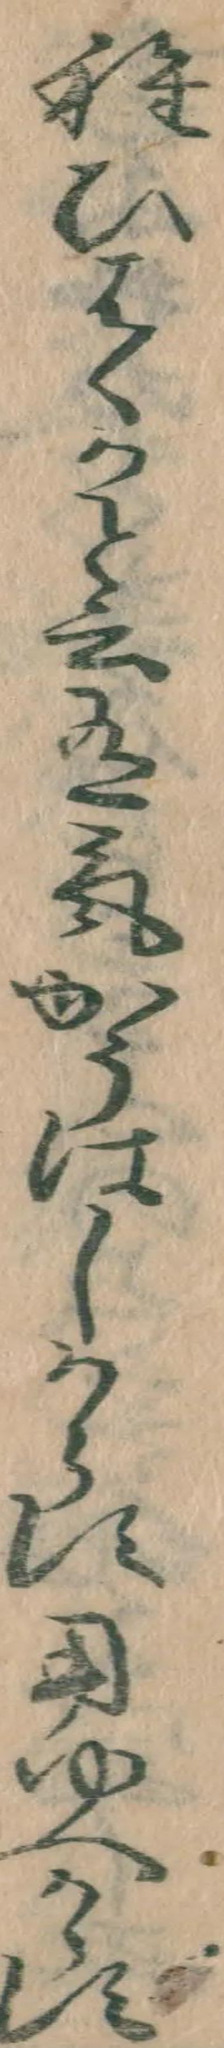種ひはくかと云有気かうはしからす用ゆへからす
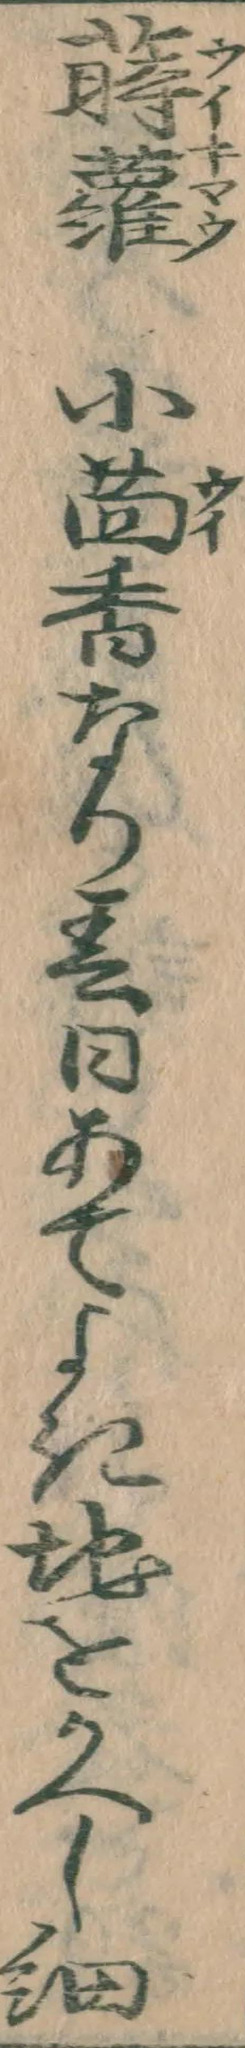蒔蘿小茴香ななり春日あてよき地をかへし細
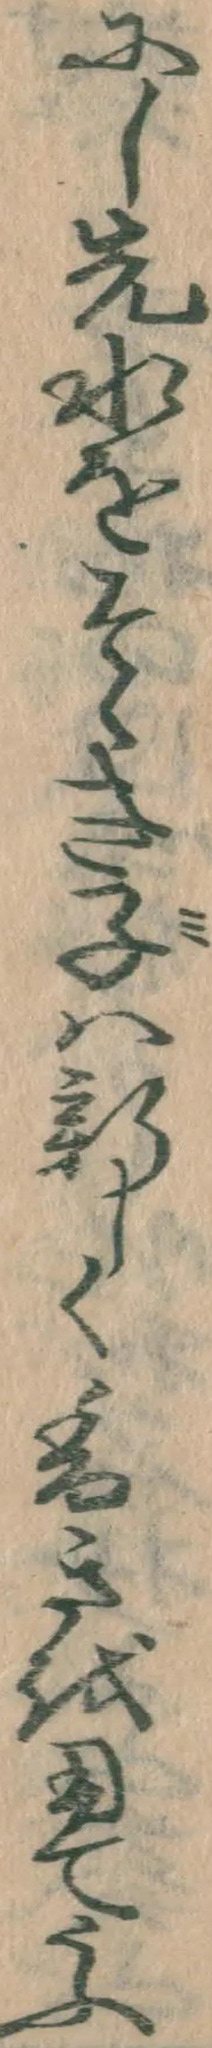にして先水をそゝき子は新しく香きを用てうふ
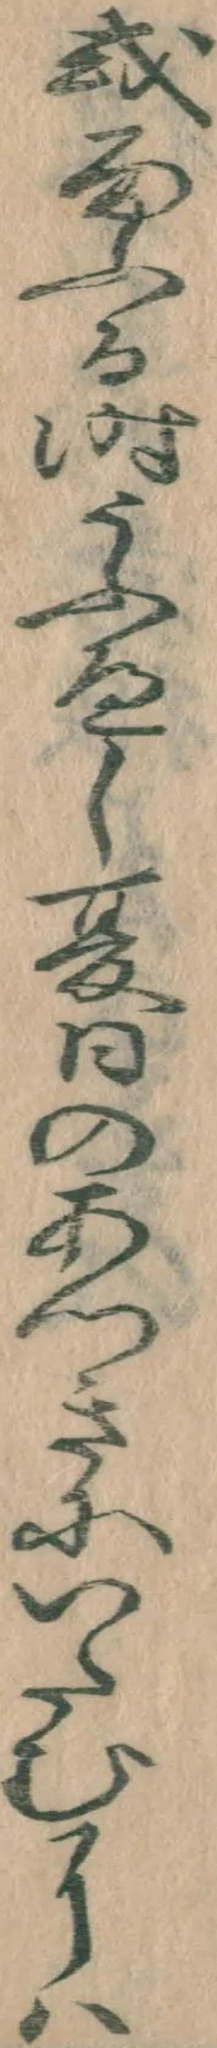或雨ふる時うふへし夏日のあつきにいたむには
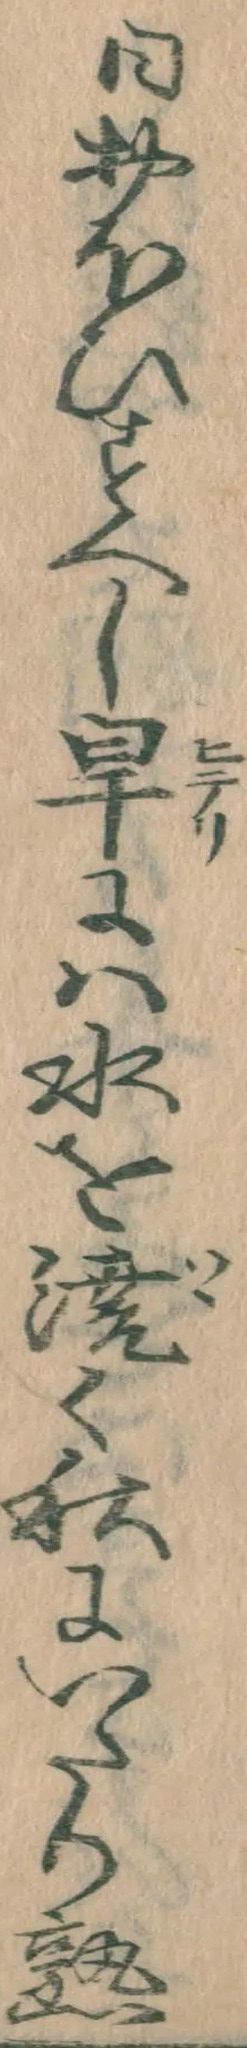日おほひすへし旱には水を澆く秋にいたり熟
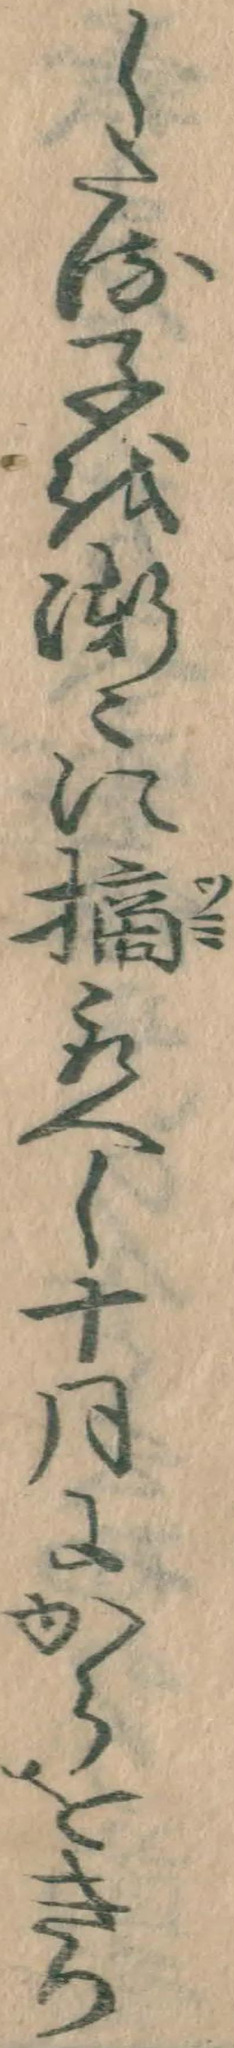したる子を漸々に摘取へし十月にからをきり
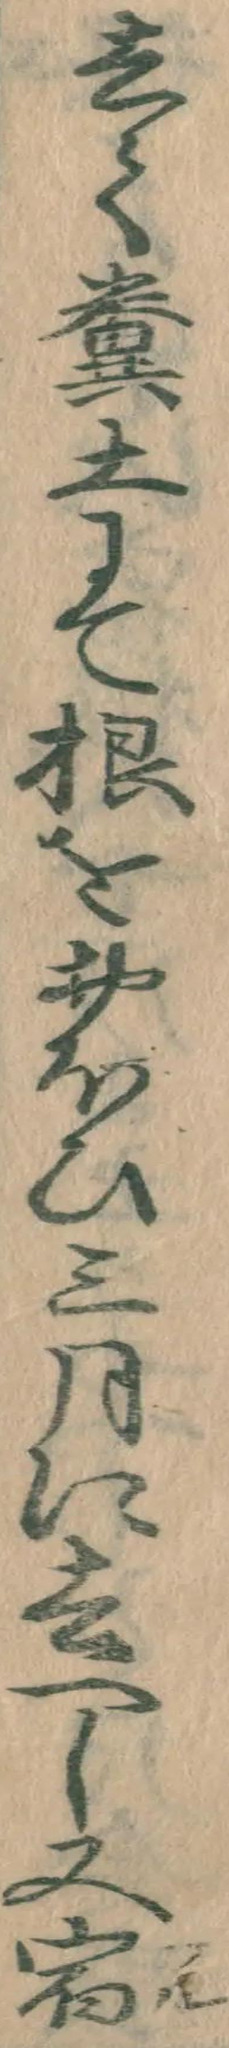去て糞土にて根をおほひ三月に去へし又宿

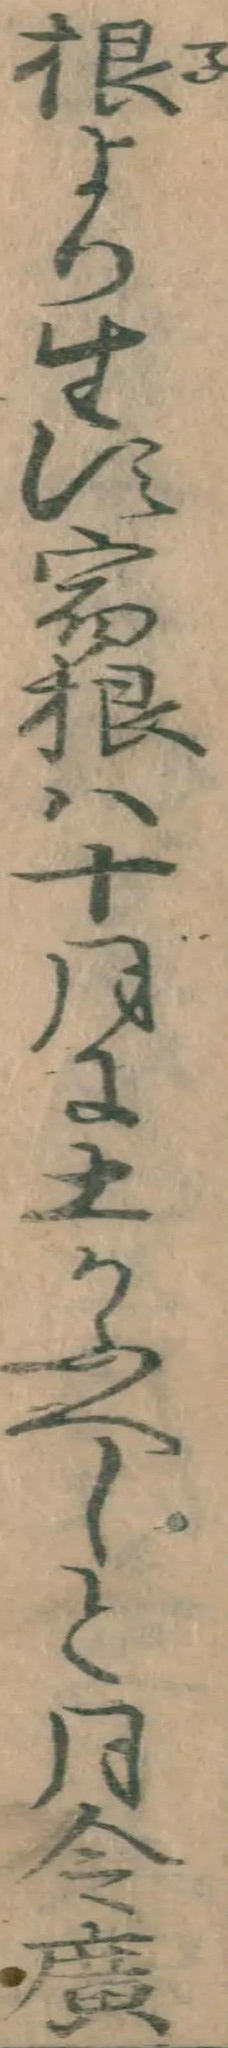根より生す宿根は十月に土うふへしと月令広
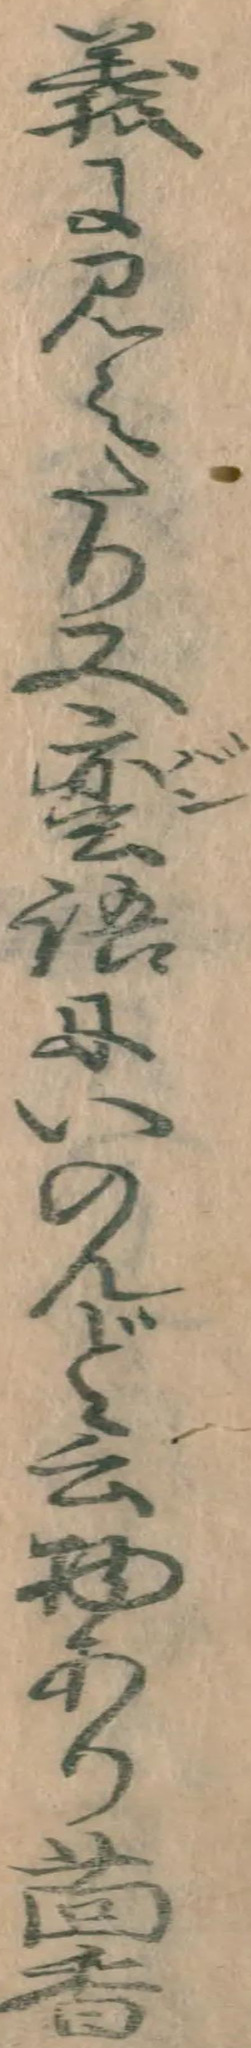義に見えたり又蛮語にいのんどゝ云物あり茴香
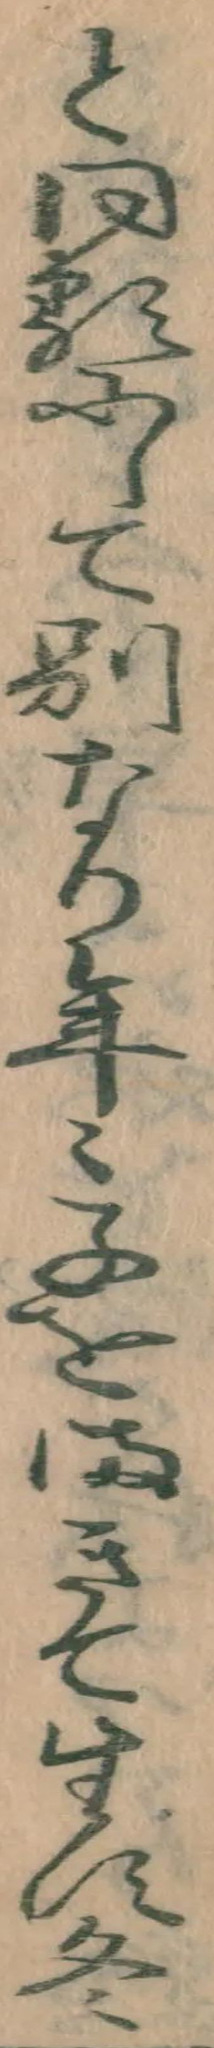と同類にして別なり年々子をまきて生す冬
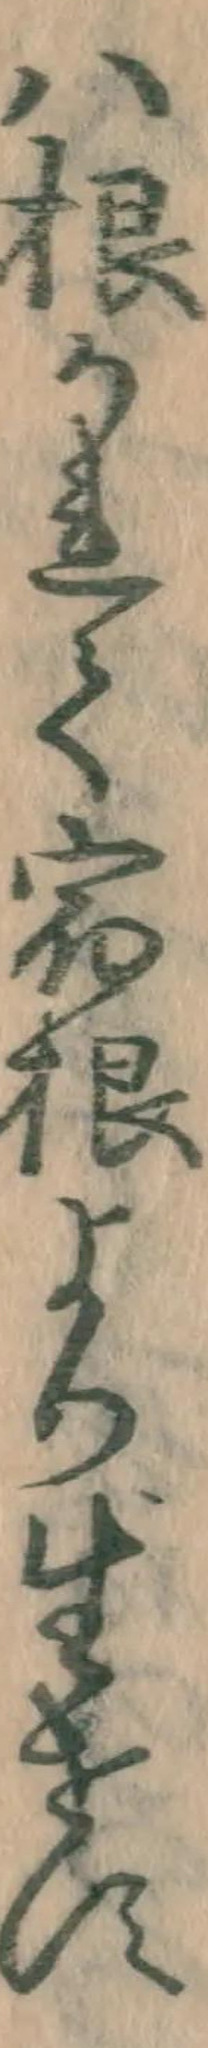は根かれて宿根より生せす
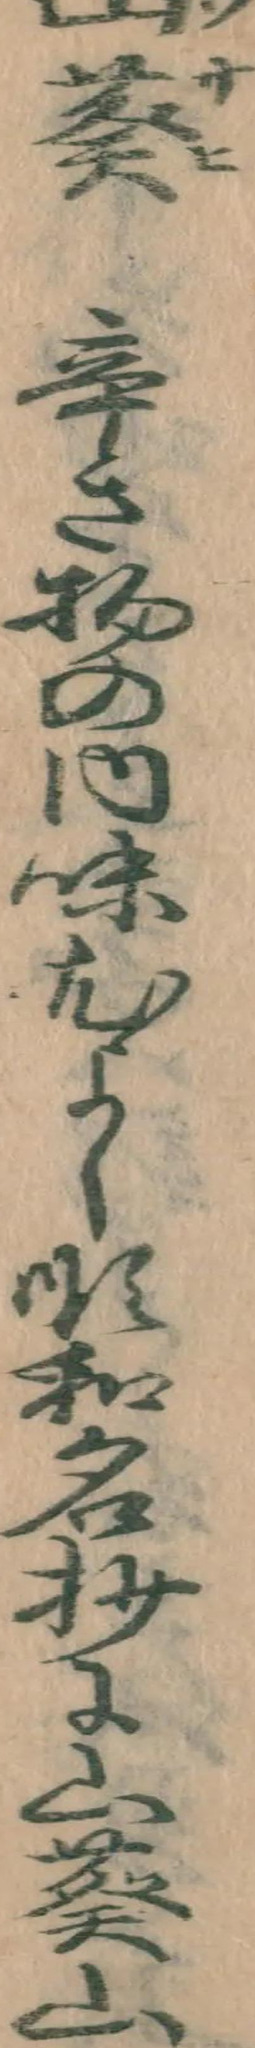山葵辛き物の内味尤よし順和名抄に山葵山
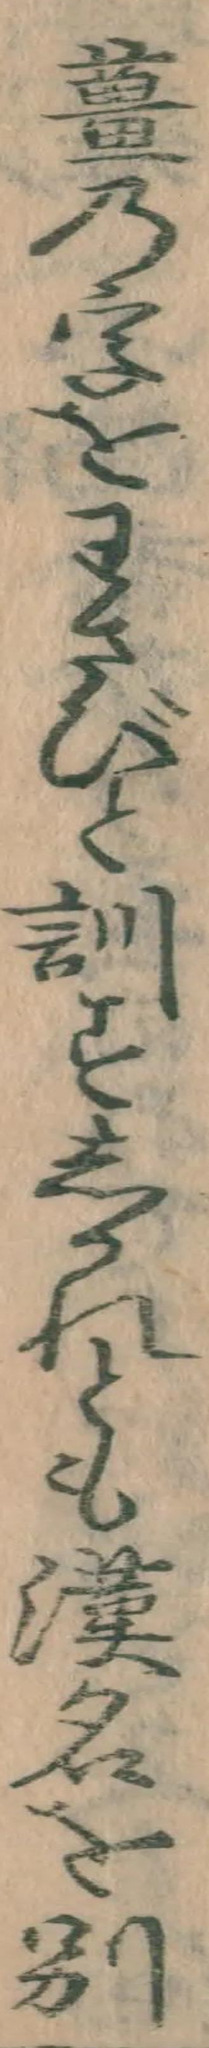薑の字をわさびと訓すしかれとも漢名を別
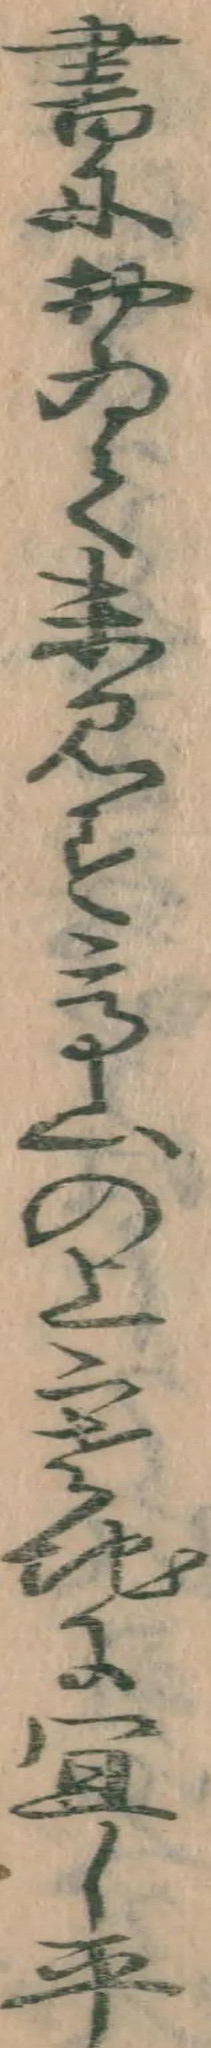書におゐて未見す高山の上寒地に宜し平
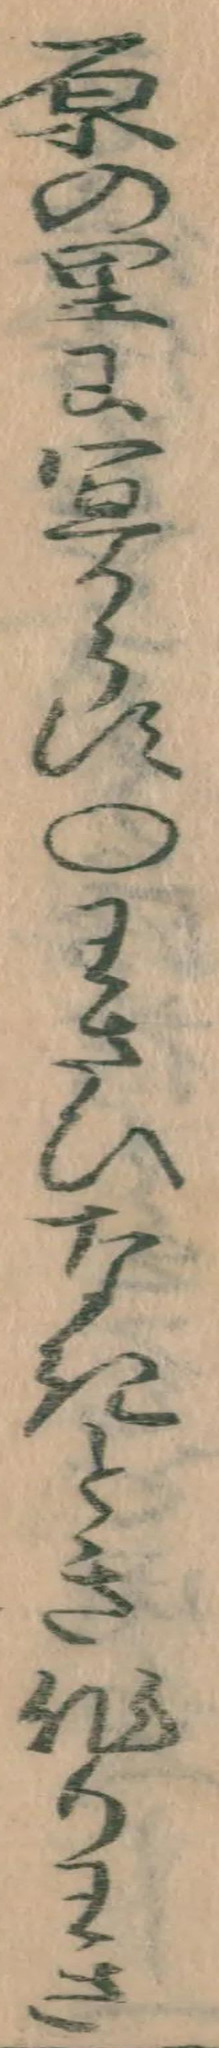原の里に宜からす〇わさひなきとき作りわさ
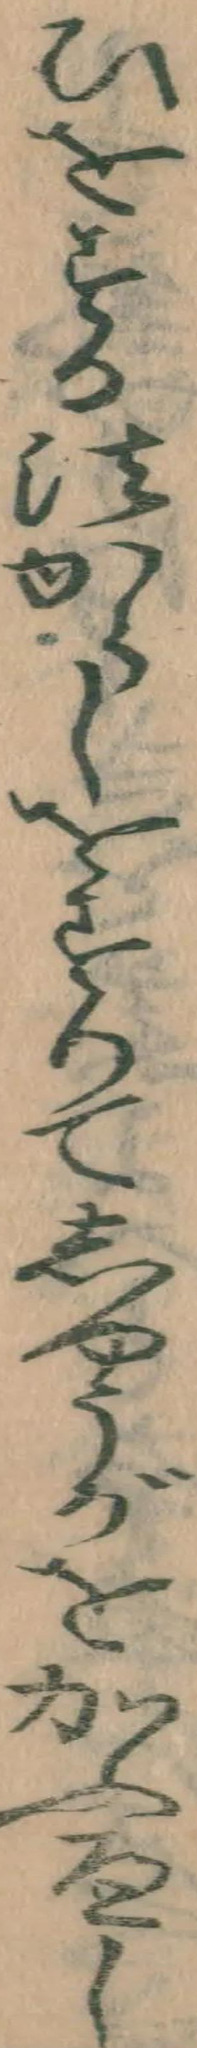ひをする法からしをすりてしやうがを加ふるへし
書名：菜譜 3巻
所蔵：国立国会図書館 National Diet Library, JAPAN
